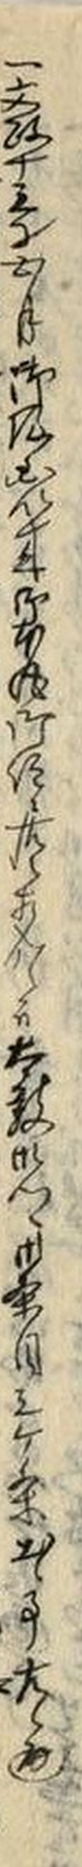一文政十三寅五月御帰国以来御本丸御住居に相成候二付太鼓御門へ御条目三ヶ条出候事左之通
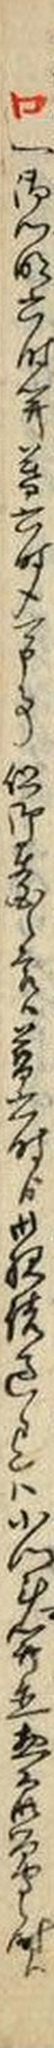一御門明六時開暮六時〆可申事但御在国之節暮六時ゟ御夜詰通候迄は小門斗開置惣而御留守之時は

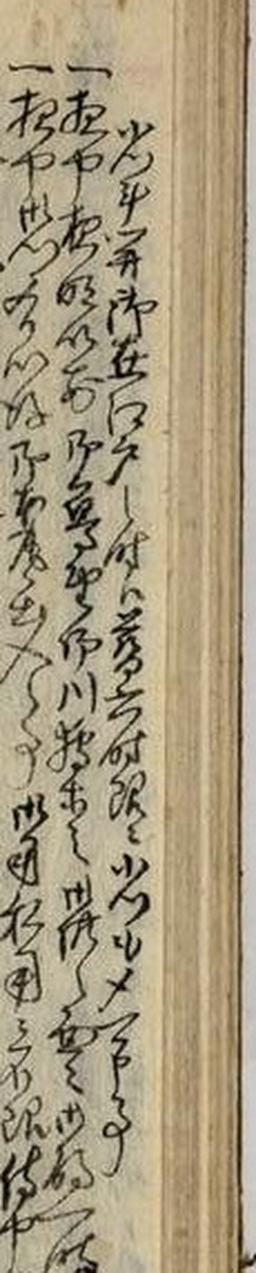小門斗開御在江戸之時は暮六時限に小門も〆可申候事
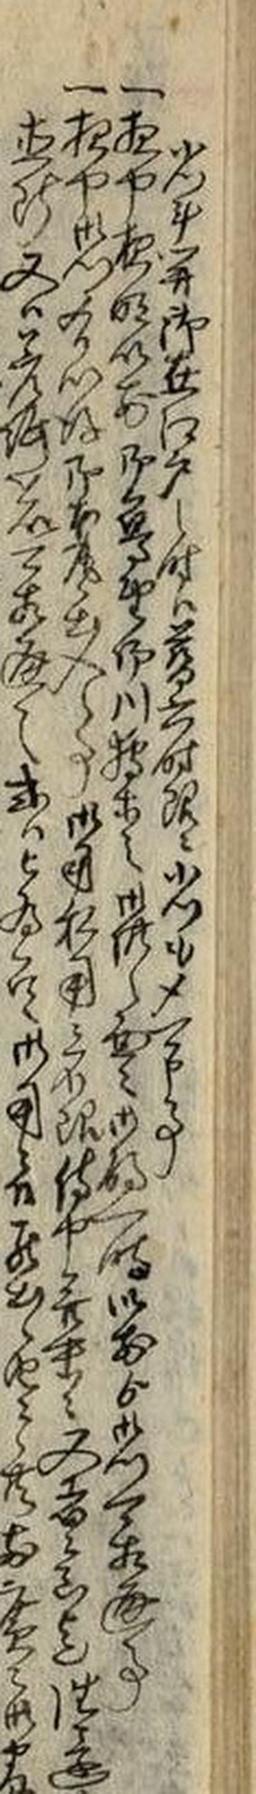一夜中夜明以前御鷹野御川狩等之御供之面々御触一時以前ゟ御門可相通候事
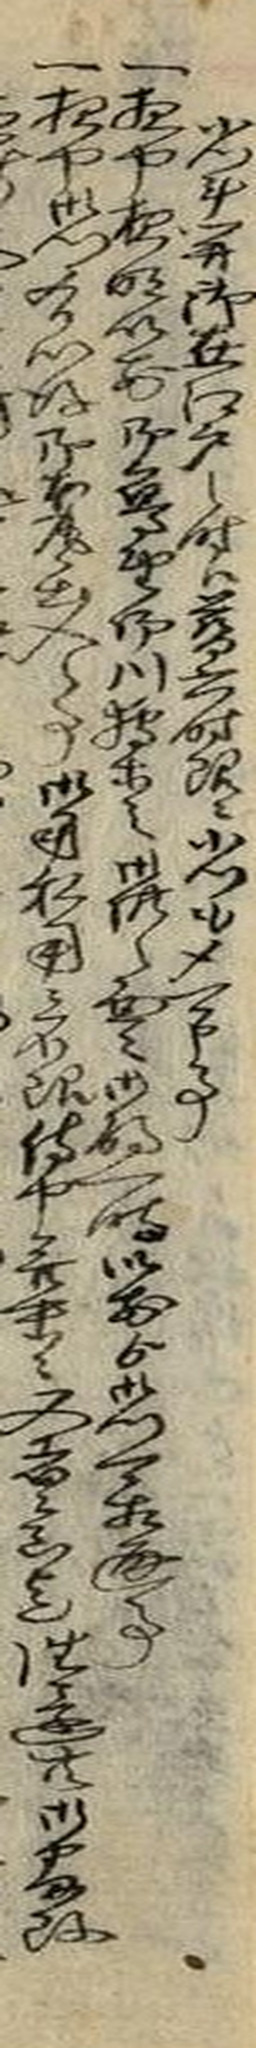一夜中御門〆り以後御本丸へ出入候事御用私用に不限侍中并末々又者に至迄往還共御番改
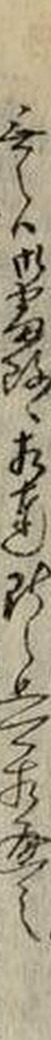無之候は御番改へ相達断之上可相通之
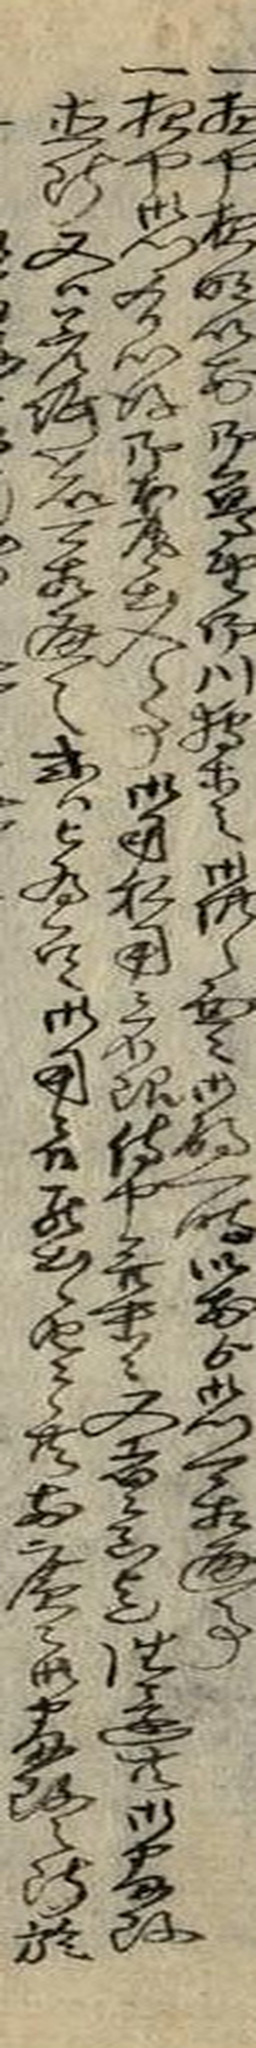直断又は差紙を以可相通之或は被為召御用に付罷出候由に候共前広に御番改之断於
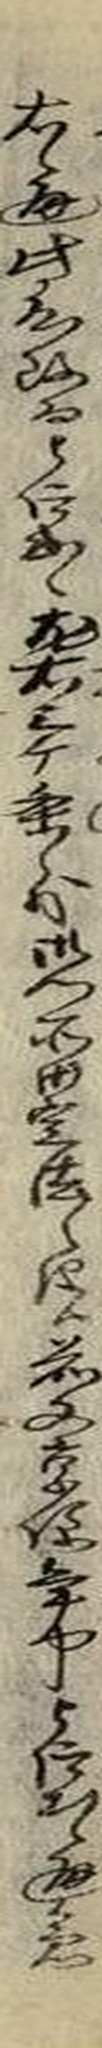右之通此度改而被仰出候尤右三ヶ条之外御門所御定法之儀は前文享保年中被仰出候通急
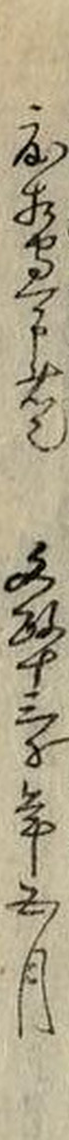度相守可申者也文政十三寅年五月
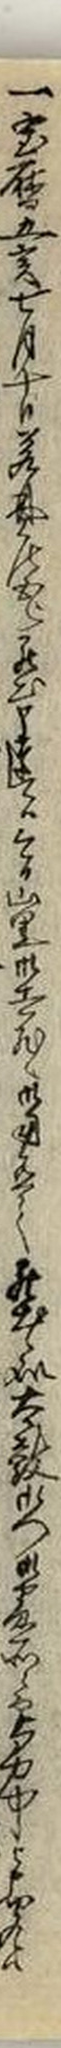一宝暦五亥七月十日若林庄五郎罷出申達候は今日山里御土蔵へ御用有之罷出候処太鼓御門御番所に而与力中被申聞候は
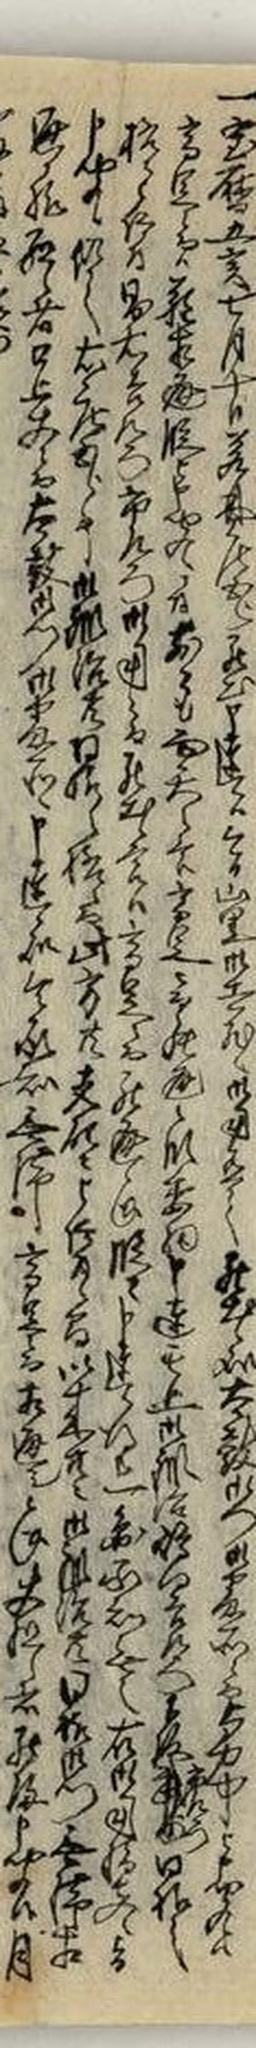格に被仰付則右吉左衛門市左衛門御用に而罷出候節は高足に而罷通候趣段々申達候得共一円承知無之右御用指支候旨
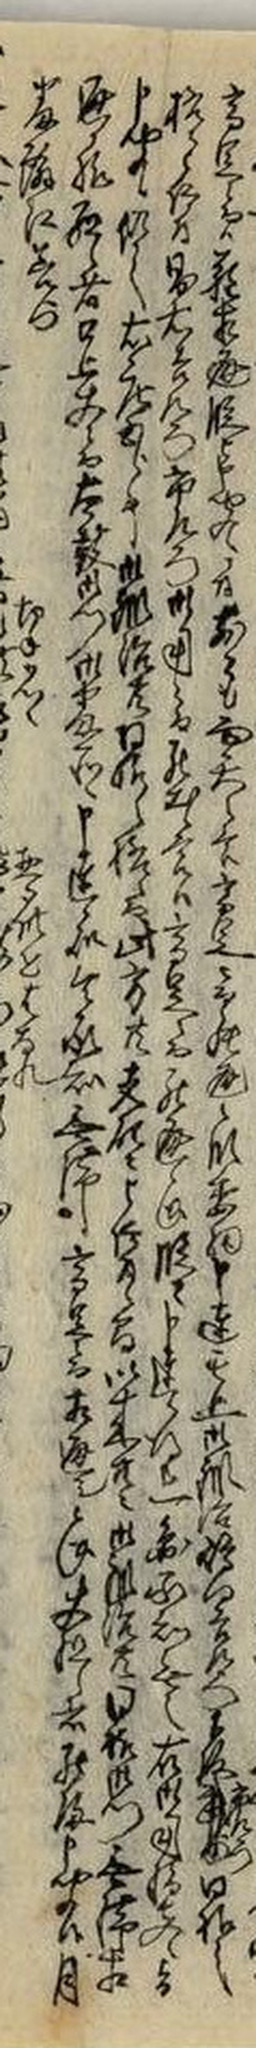申聞候仍之右庄五郎方御鍛冶共同様之格に而此方共支配に被仰付候間以来共に御鍛冶共同様御門無滞相
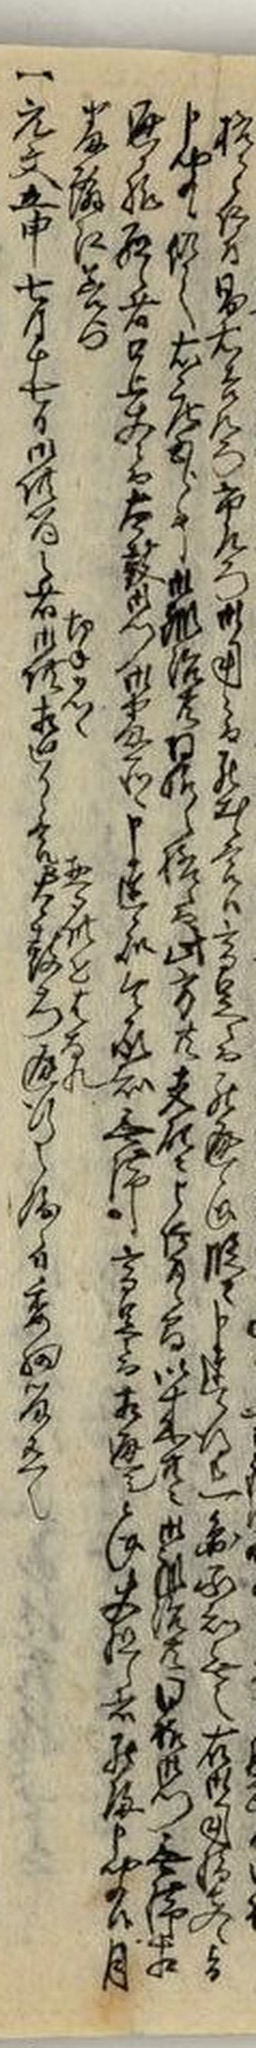通候様組之者口上使に而太鼓御門御番所へ申達候処令承知無滞高足に而相通し候趣使組之者罷帰申聞候月
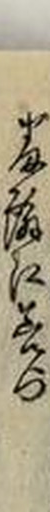番蠏江善左衛門
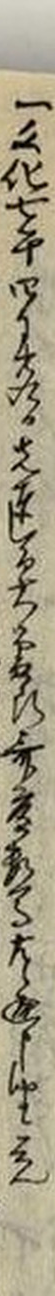一文化七午四月廿九日先達而大番頭斉馬藤数馬左之通申聞覚
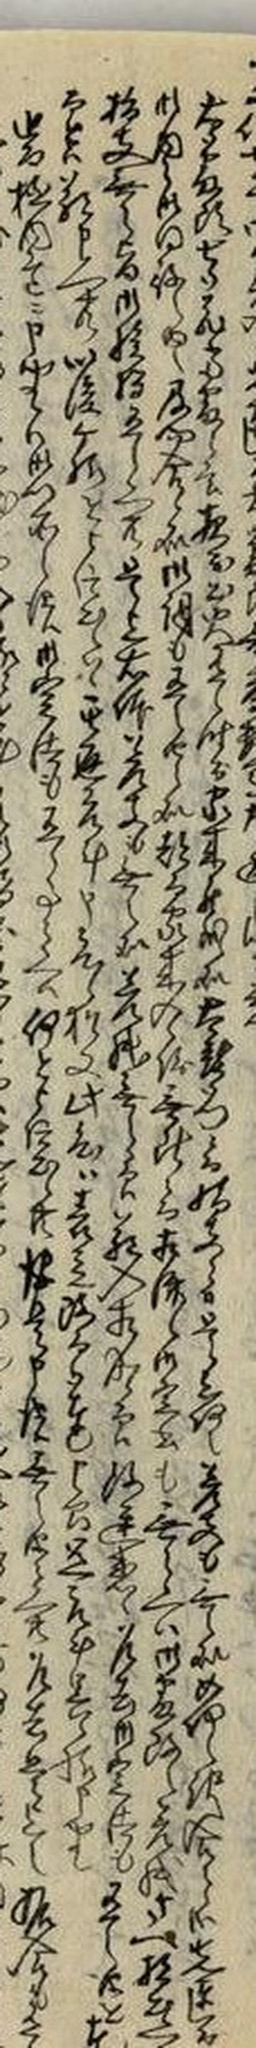指支無之候旨御挨拶有之候へ共是迄右件差支も無之候処差紙無之候而は難入相成候而は致迷惑候乍去御定法も有之儀を達
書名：御門御櫓之部
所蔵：福井県文書館 Fukui Prefectural Archives
